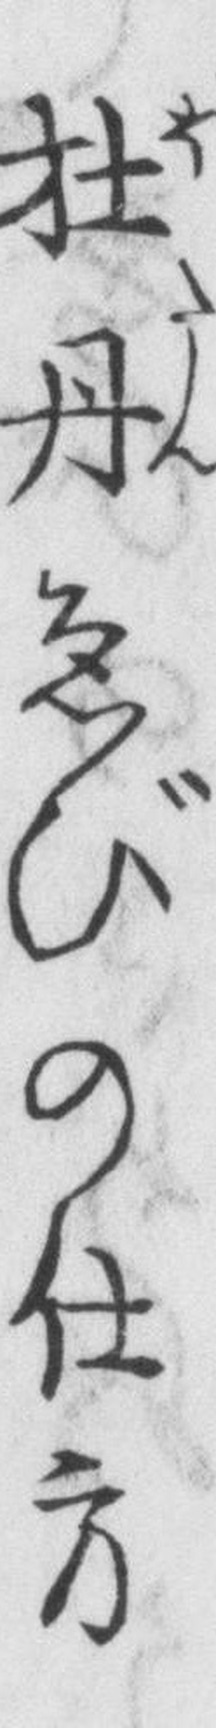牡丹ゑびの仕方
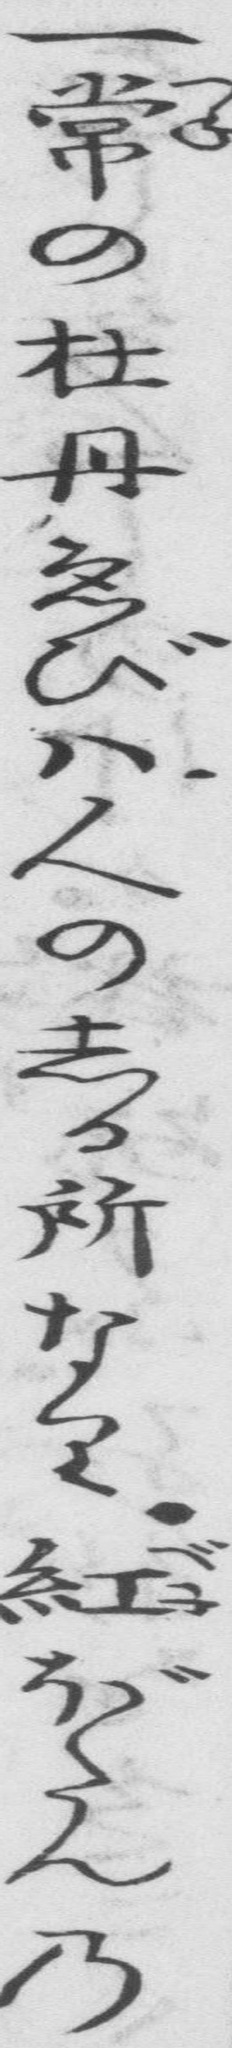一常の牡丹ゑびは。人のしる所なり。紅ぼたんの
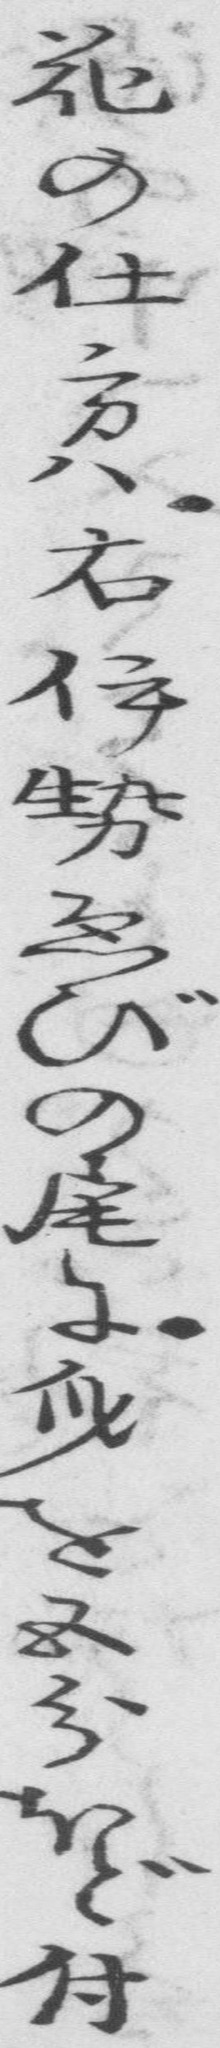花の仕方は。右伊勢ゑびの尾に。身を五分ほど付
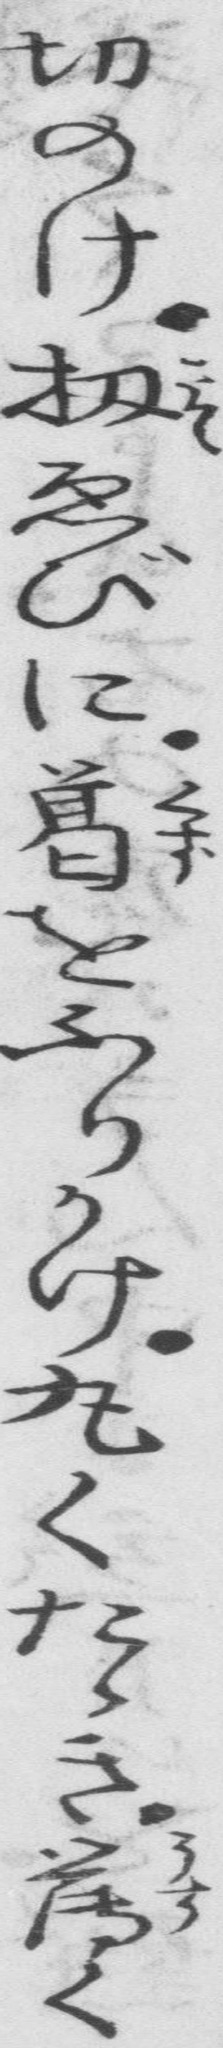切のけ。扨ゑびに。葛をふりかけ。丸くたゝき。薄く
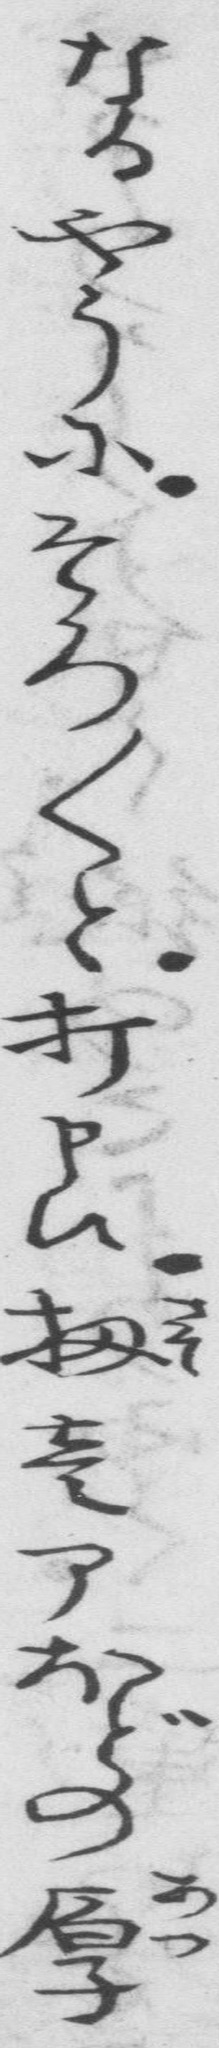なるやうに。そろ〳〵と。打申候。扨壱分ほどの厚
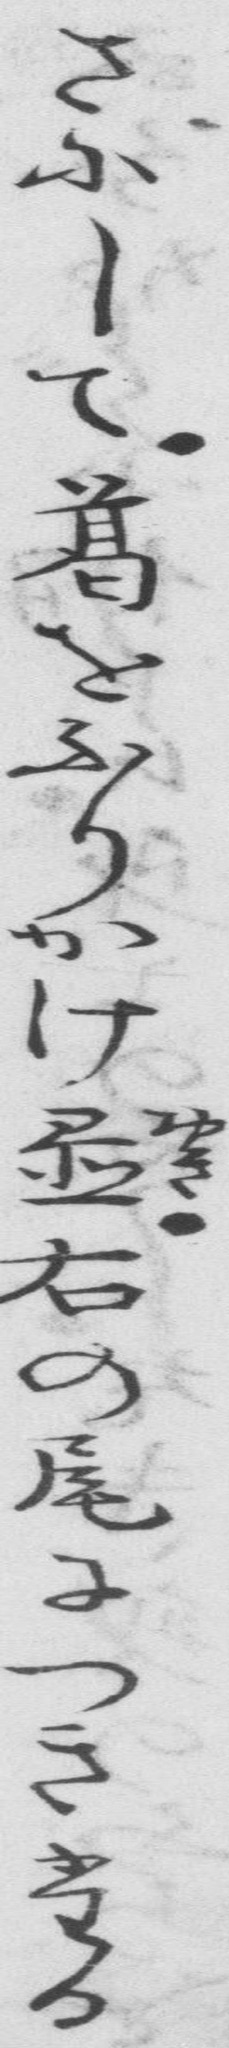さにして。葛をふりかけ置。右の尾につきたる
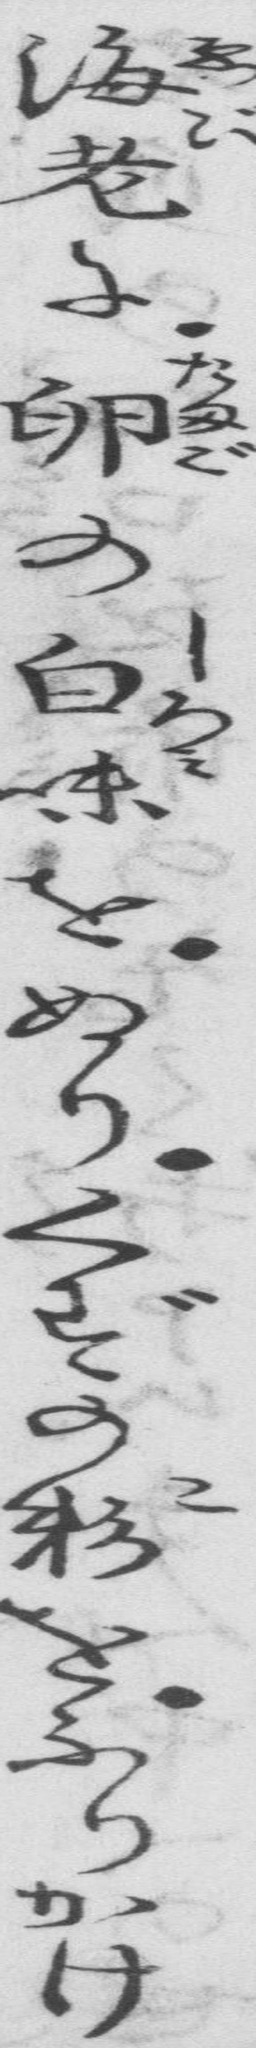海老に。卵の白味を。ぬり。くずの粉を。ふりかけ

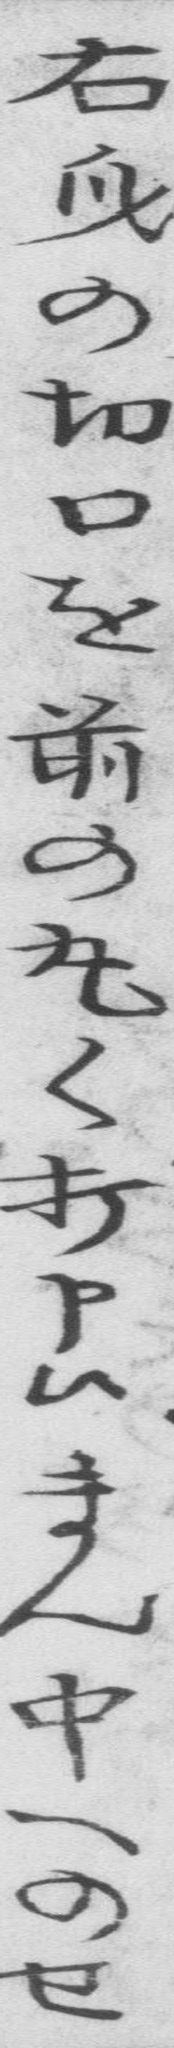右身の切口を。前の丸く打申候。まん中へのせ
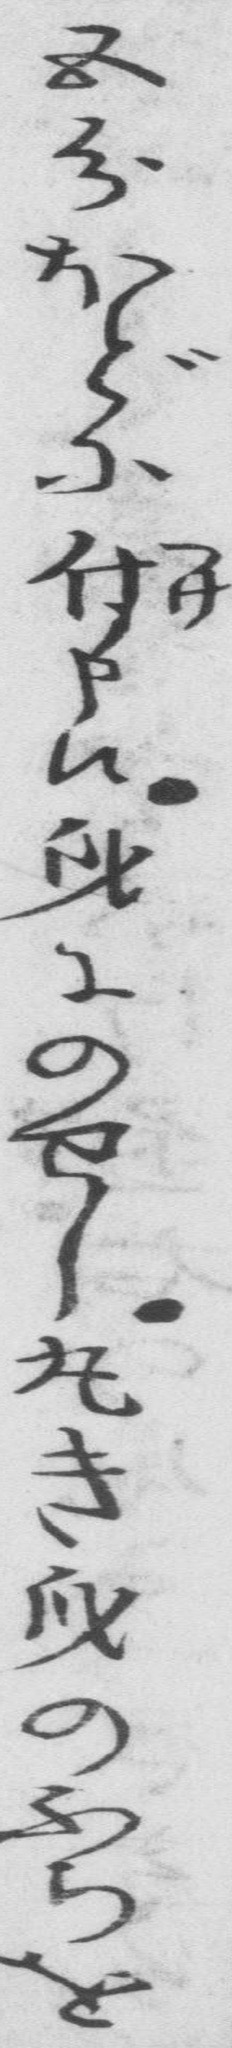五分ほどに付申候。身にのせし。丸き身のふちを
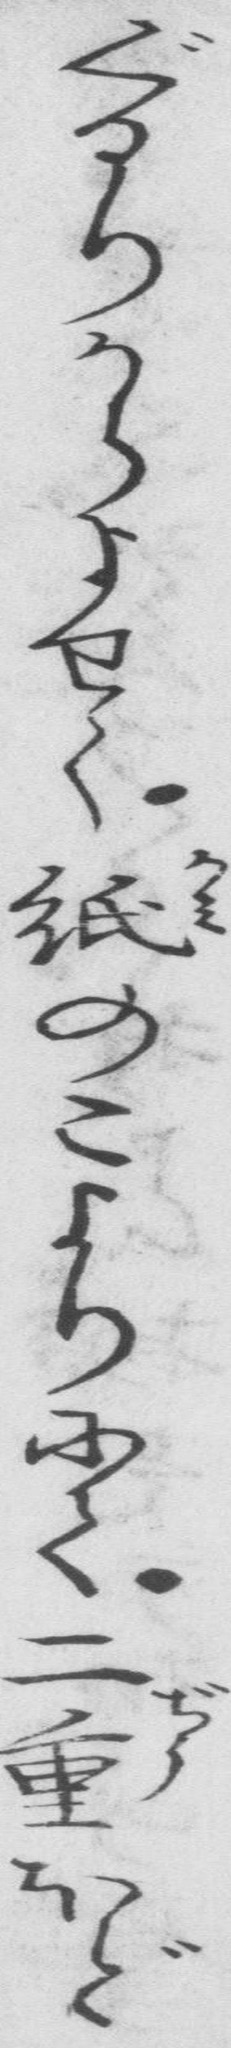ぐるりからよせて。紙のこよりにて。二重ほど
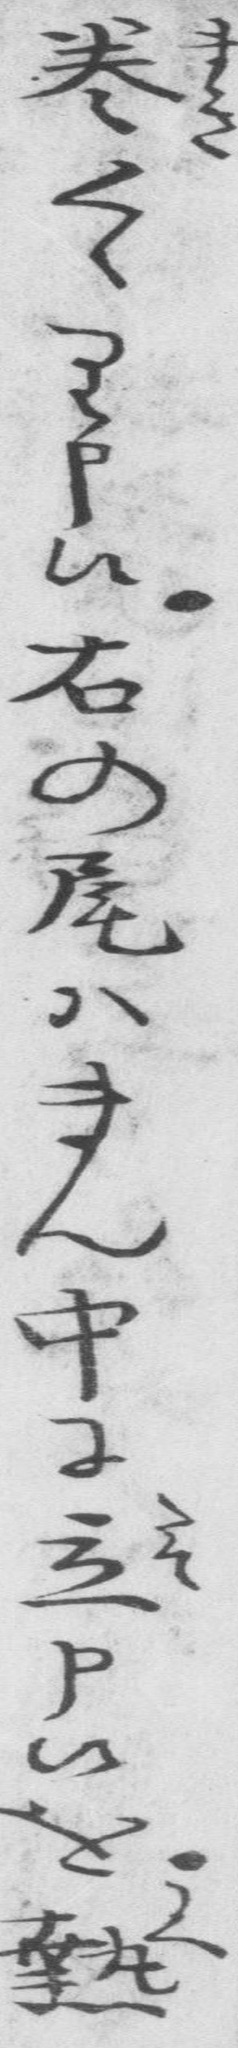巻くゝり申候。右の尾はまん中に立申候を。熱
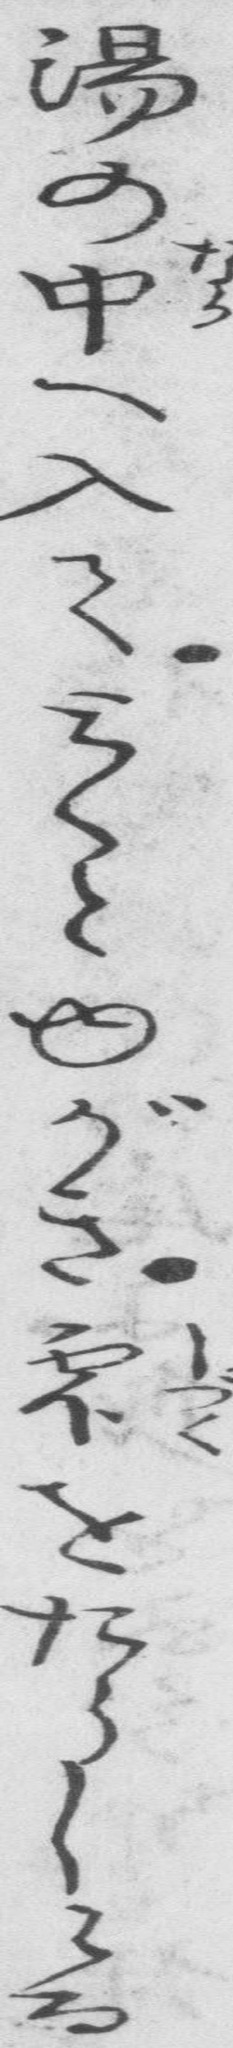湯の中へ入て。とくとゆがき。雫をたらしにて
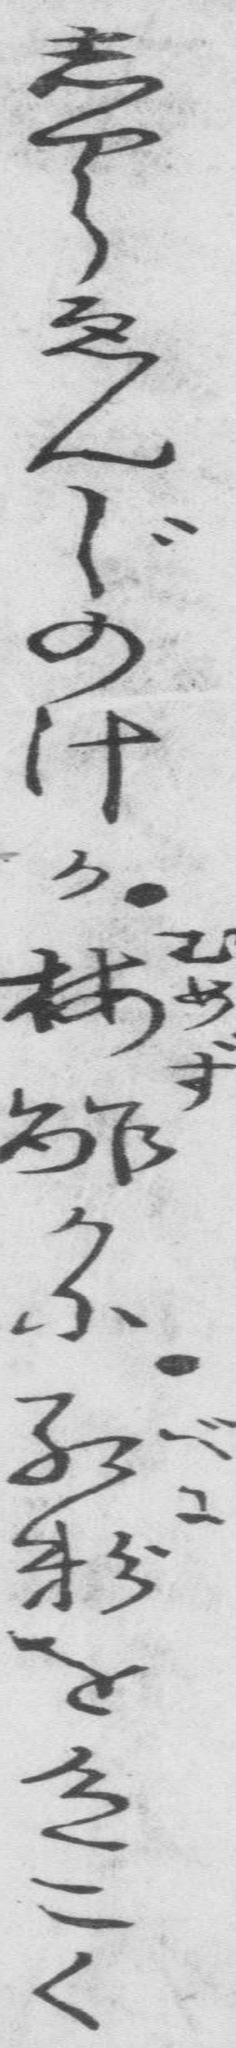しやうゑんじの汁か。梅酢かに。紅粉を色こく
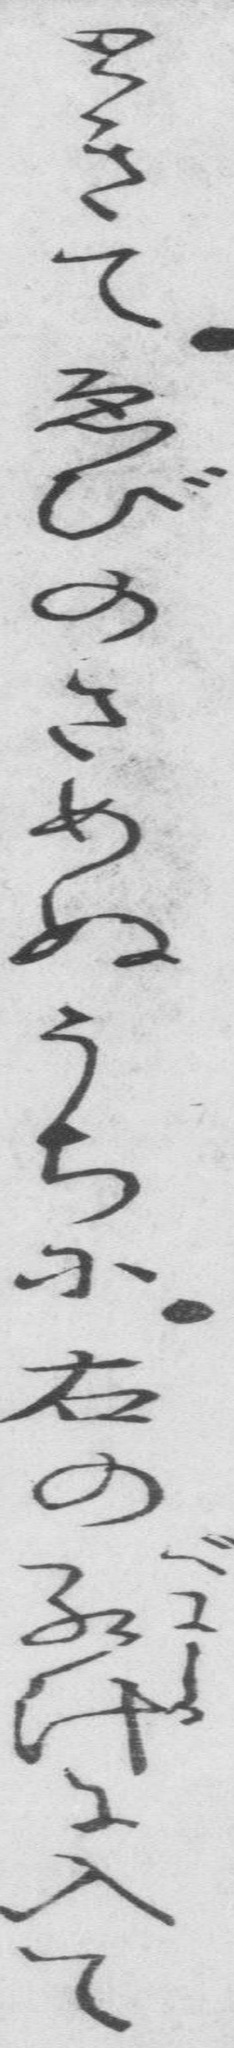ときて。ゑびのさめぬうちに。右の紅汁に入て
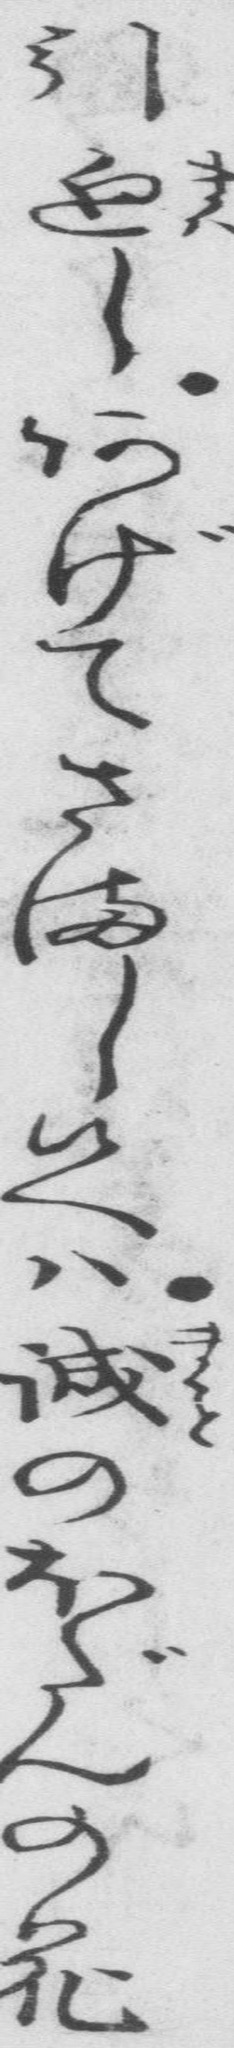引廻し。あげてさまし候へは。誠のぼたんの花
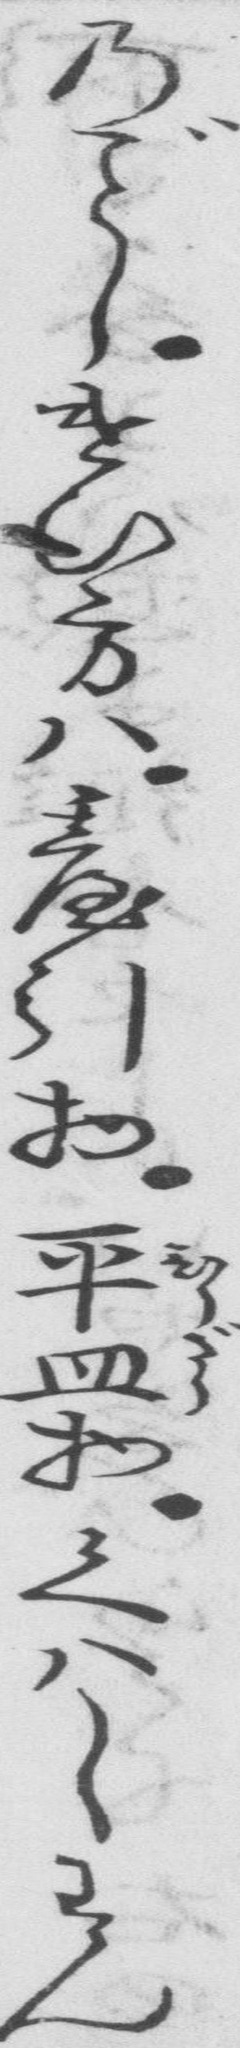のごとし。遣ひ方は。台引物。平皿物。くはしわん
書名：萬寳料理秘密箱
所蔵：大阪府立大学学術情報センター 国文学研究資料館
